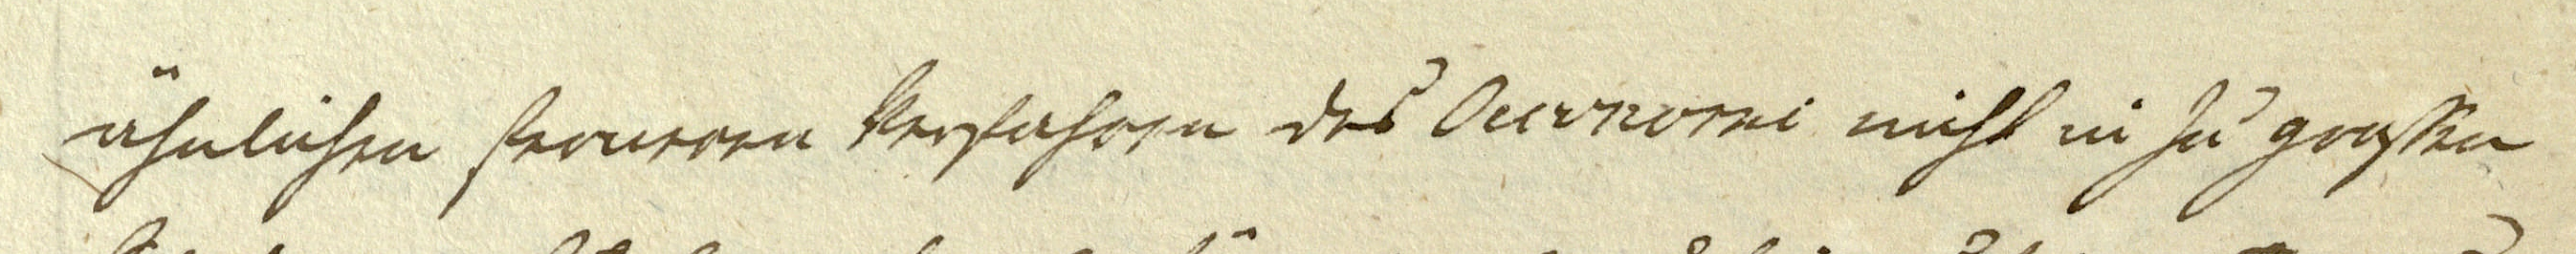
ähnlichen ferneren Verfahren des Oeconomi nicht in zu grossen
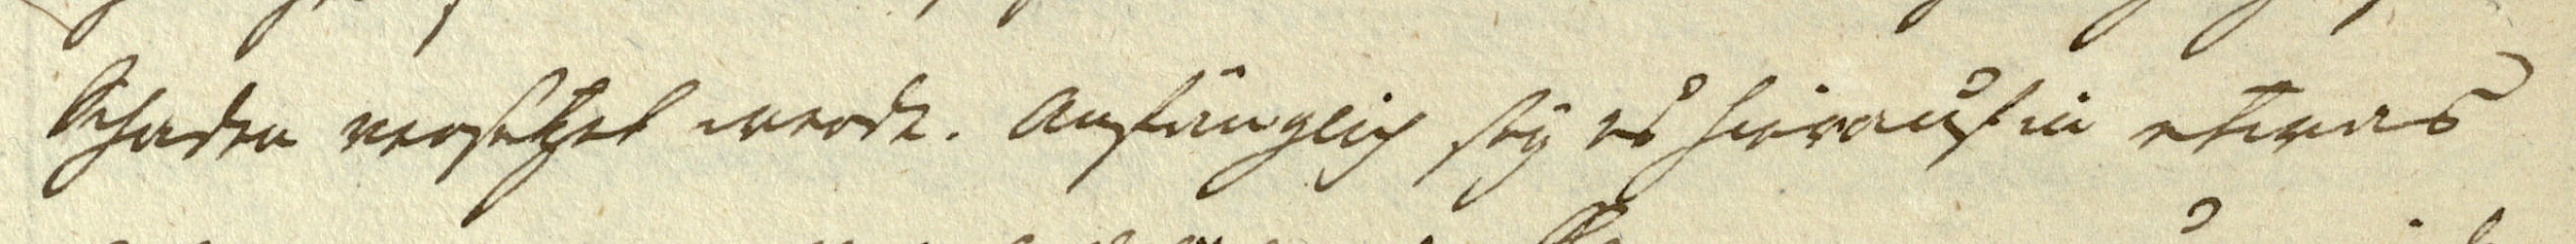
Schaden versetzet werde. Anfänglich seÿ es hieraufin etwas
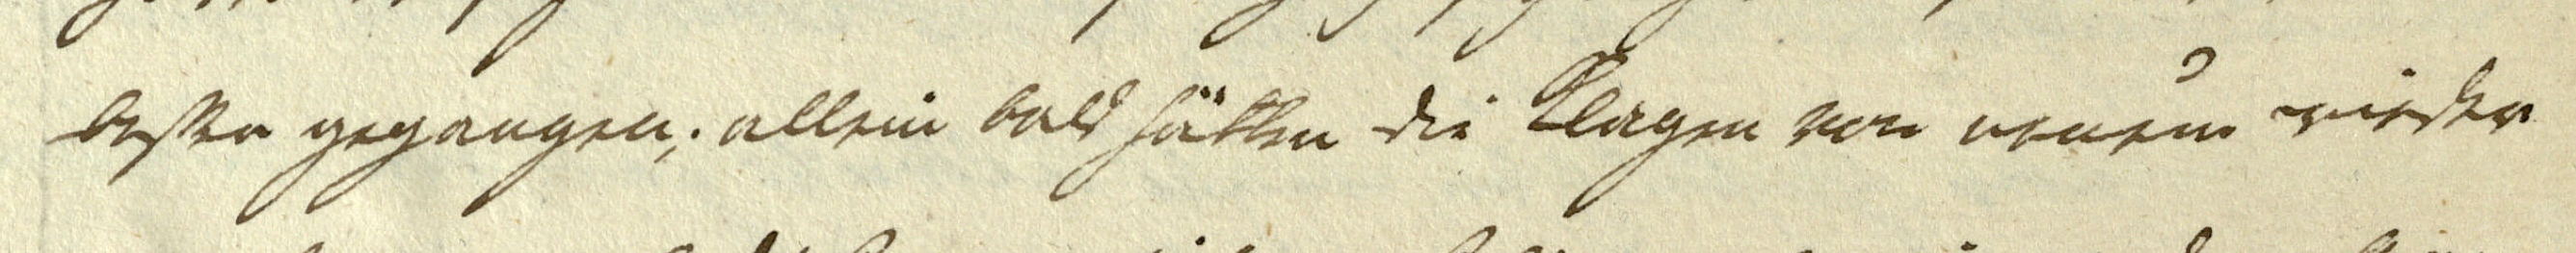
besser gegangen, allein bald hätten die Klagen von neuem wieder
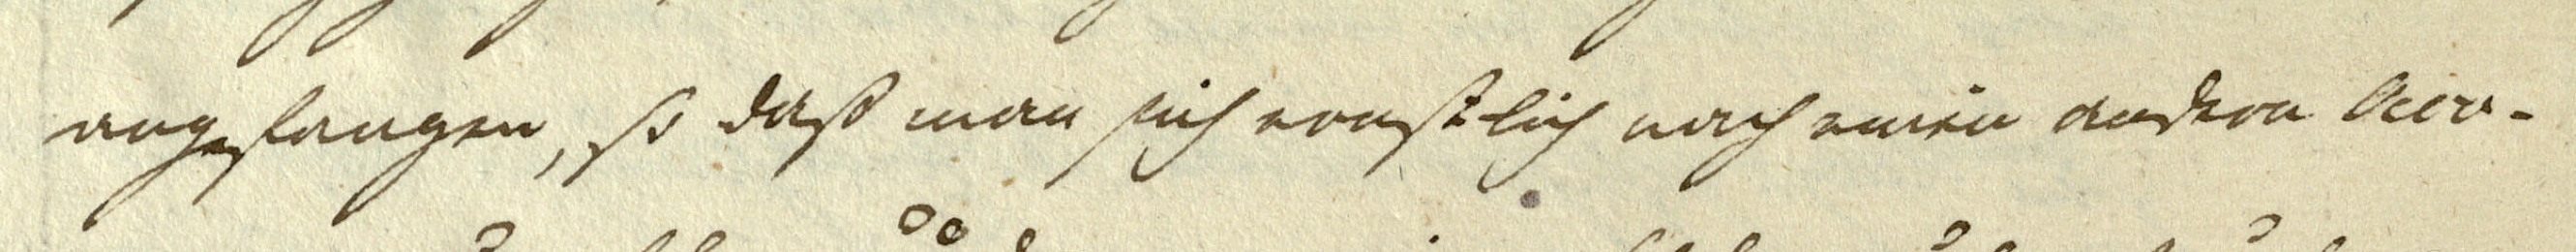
angefangen, so daß man sich ernstlich nach einen andern Oeco¬
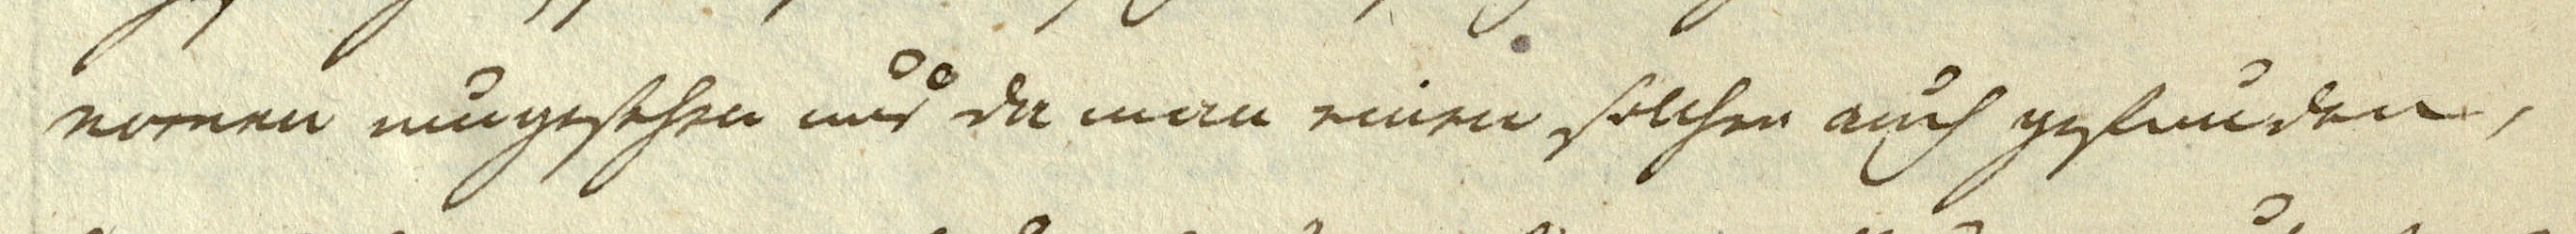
nomen umgesehen und da man einen solchen auch gefunden,
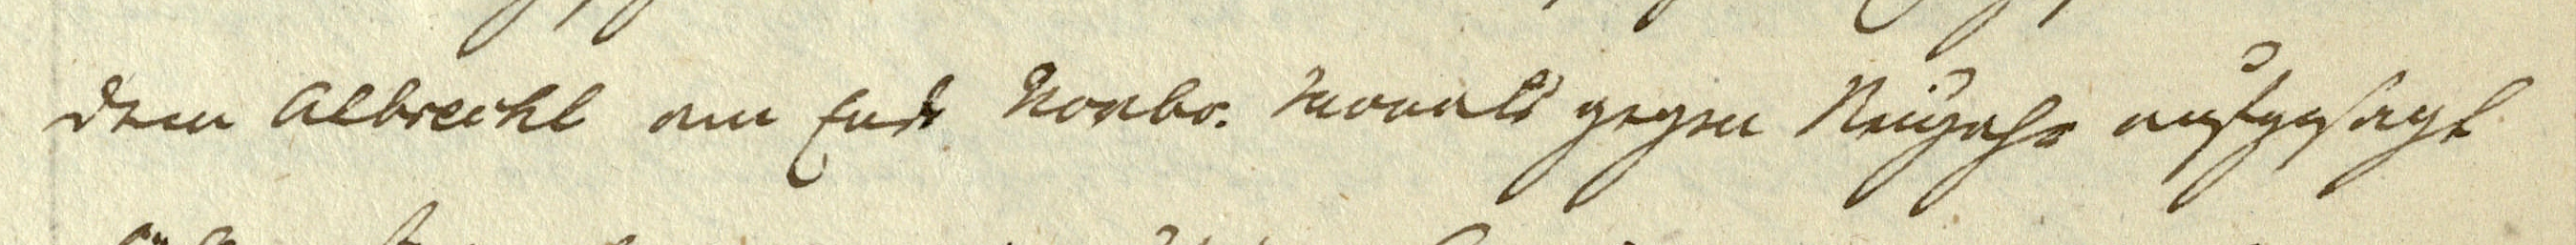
dem Albrechl am Ende Novbr. Monats gegen Neujahr aufgesagt
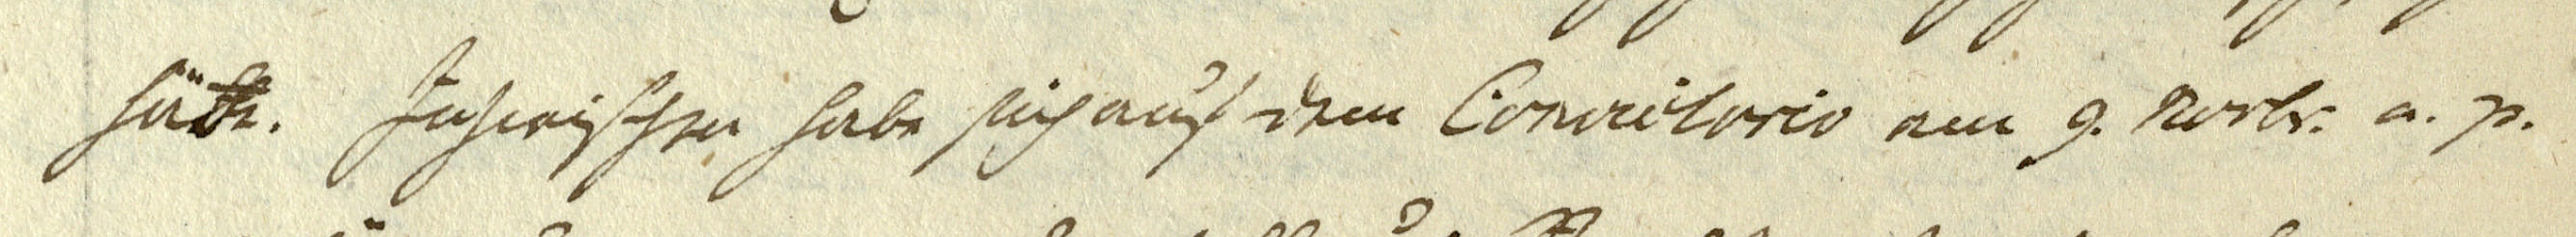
hätte. Inzwischen habe sich auf dem Convictorio am 9. Novbr. a. p.
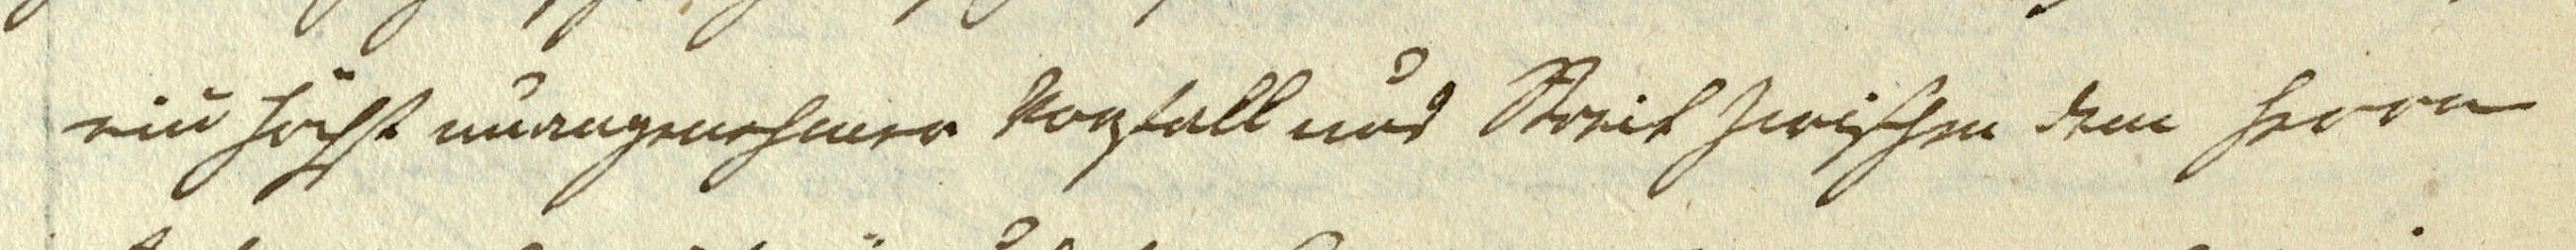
ein höchst unangenehmer Vorfall und Streit zwischen dem Herrn
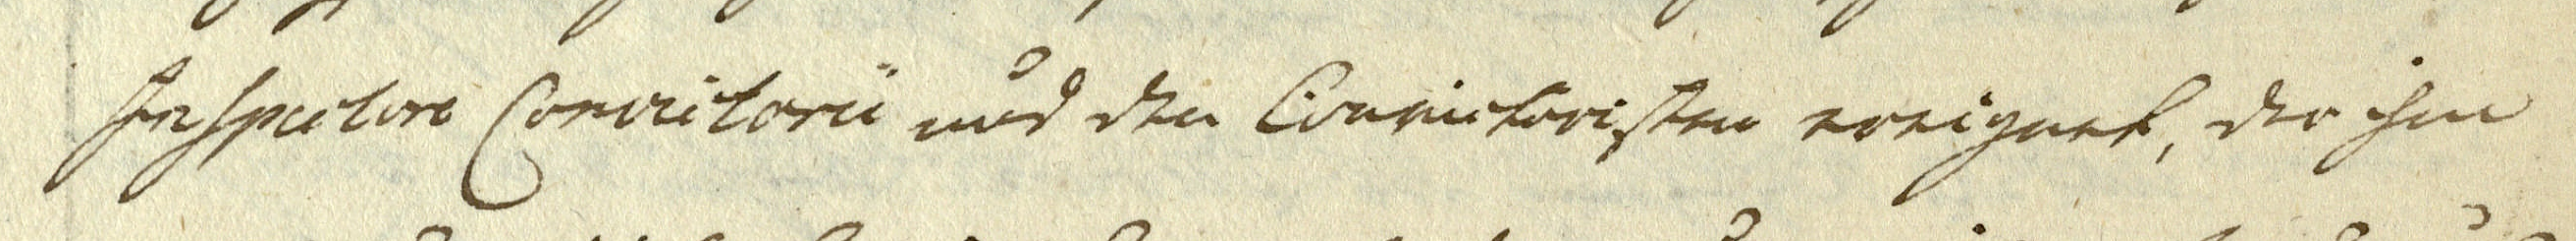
Inspectore Convictorio und den Convictoristen ereignet, der ihm
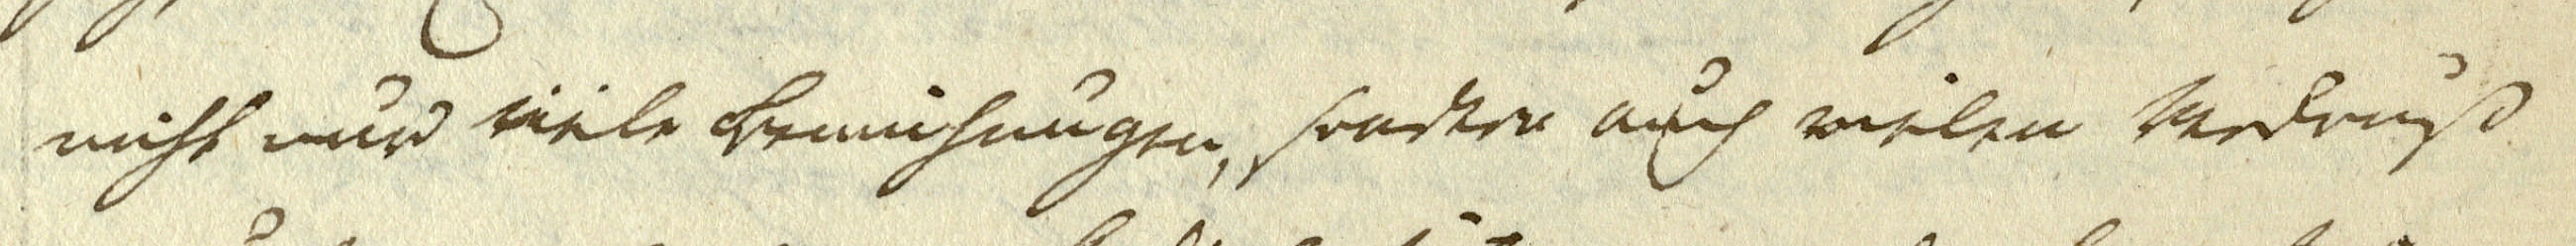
nicht nur viele Bemühungen, sondern auch vielen Verdruß
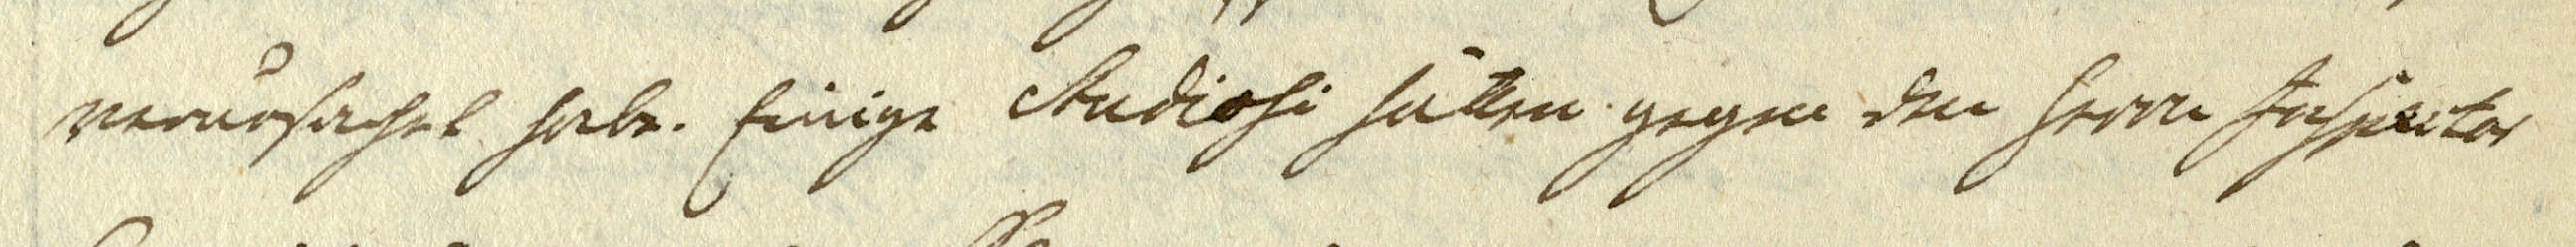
verursachet habe. Einige Studiosi haben gegen den Herrn Inspector
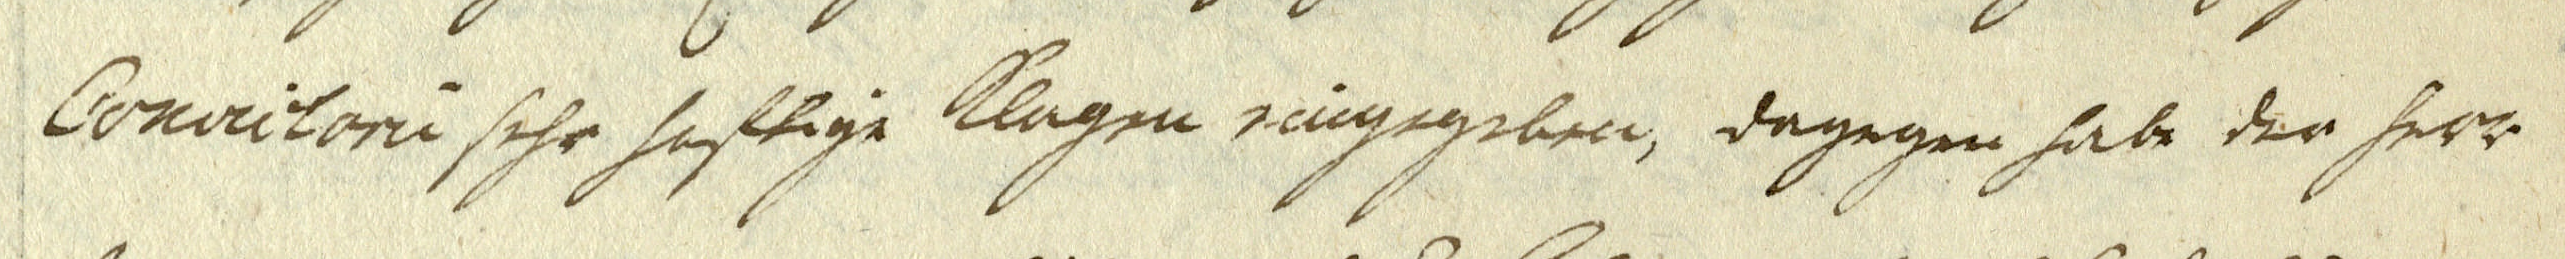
Convictorii sehr heftige Klagen eingegeben, dagegen habe der Herr
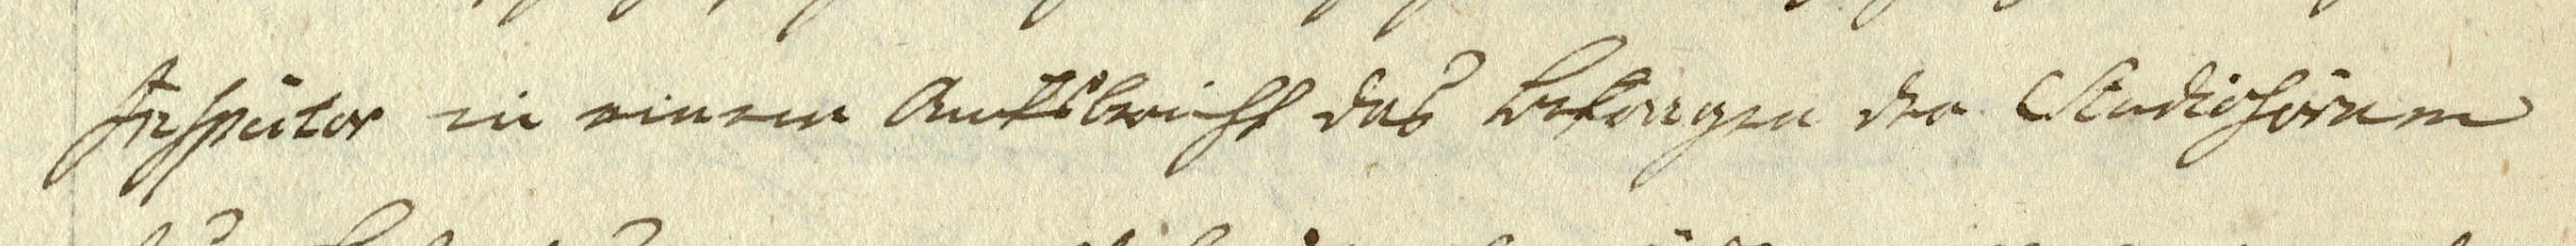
Inspector in einem Amtsbericht das Betragen der Studiosorum
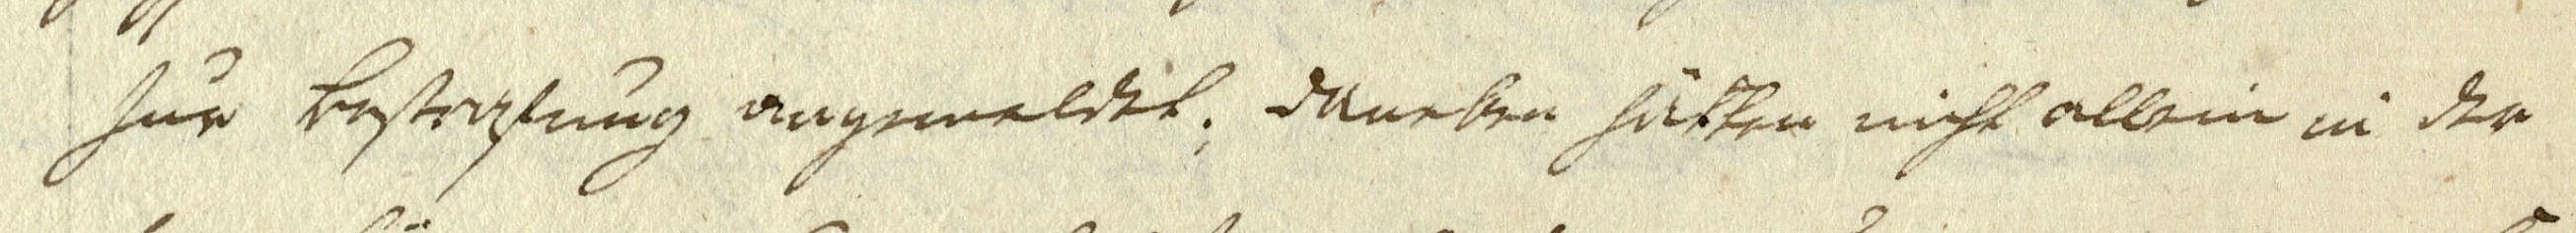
zur Bestrafung angemeldet. Daneben hätten nicht allein in der
